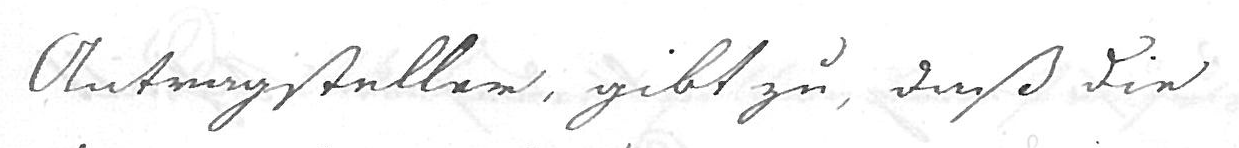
Antragsteller, gibt zu, daß die
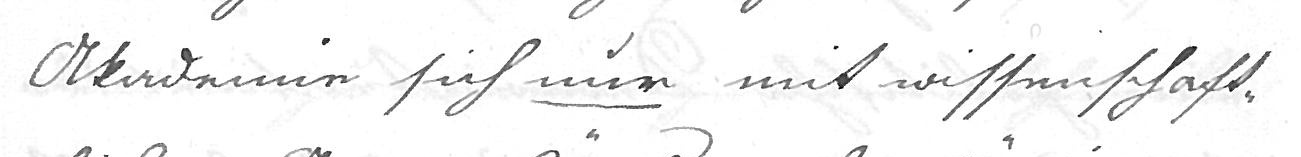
Akademie sich nur mit wissenschaft-
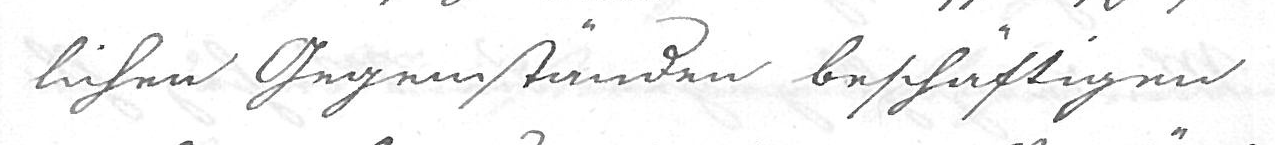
lichen Gegenständen beschäftigen
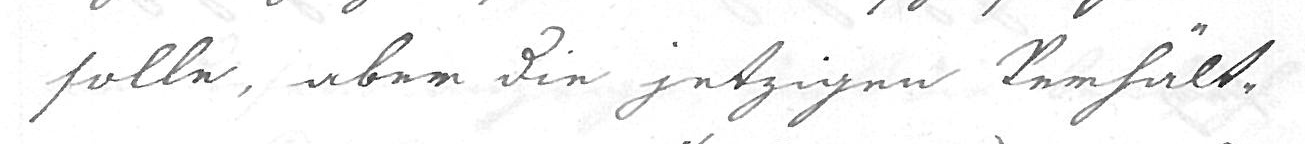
solle, aber die jetzigen Verhält-
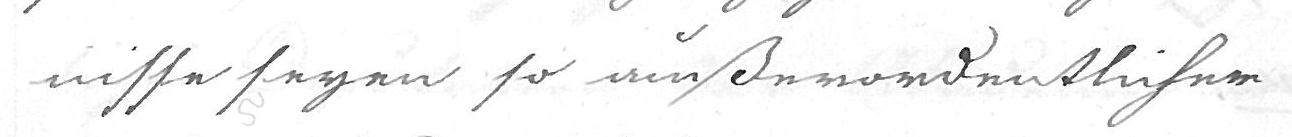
nisse seyen so außerordentlicher
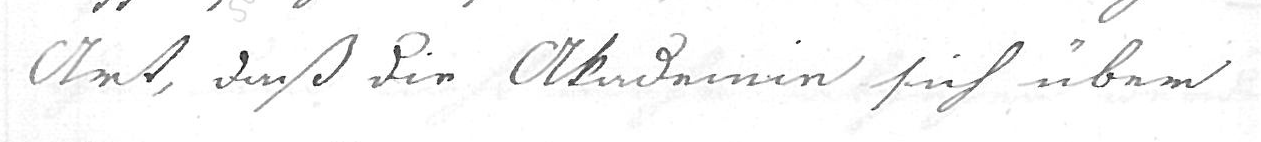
Art, daß die Akademie sich über
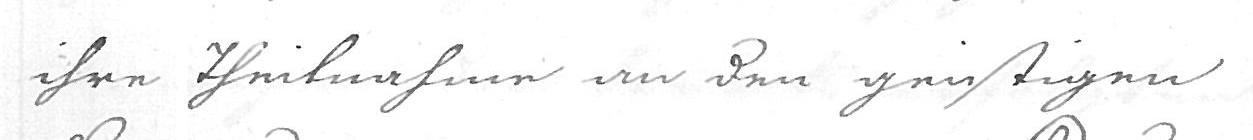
ihre Theilnahme an den geistigen
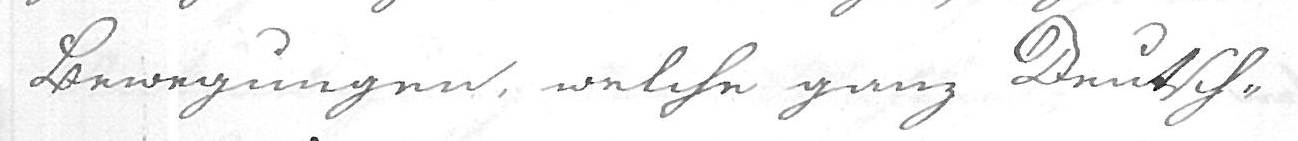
Bewegungen, welche ganz Deutsch-
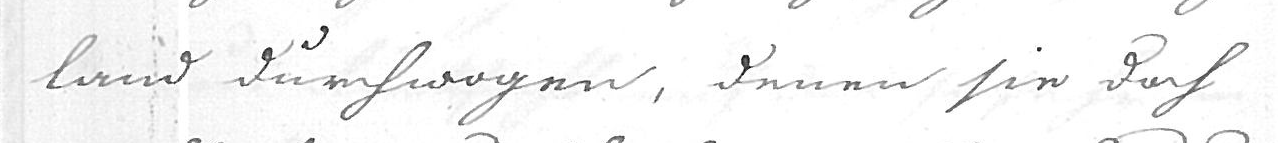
lang durchwogen, denen sie doch
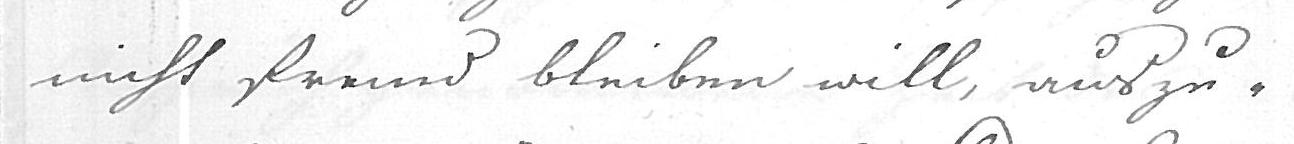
nicht fremd bleiben will, auszu-
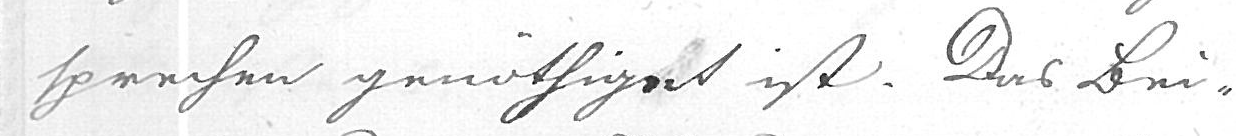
sprechen genöthiget ist. Die Bei-
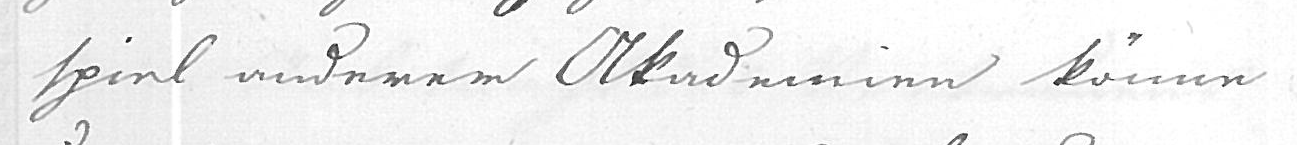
spiel anderer Akademien könne
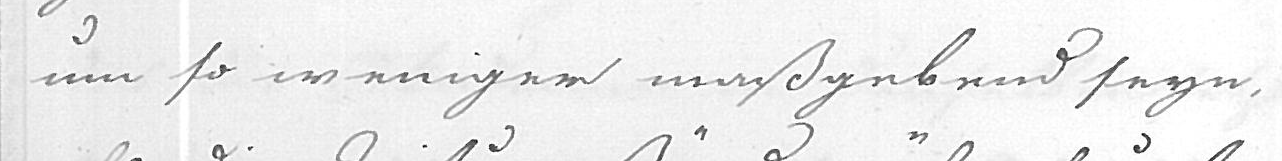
um so weniger maßgebend seyn,
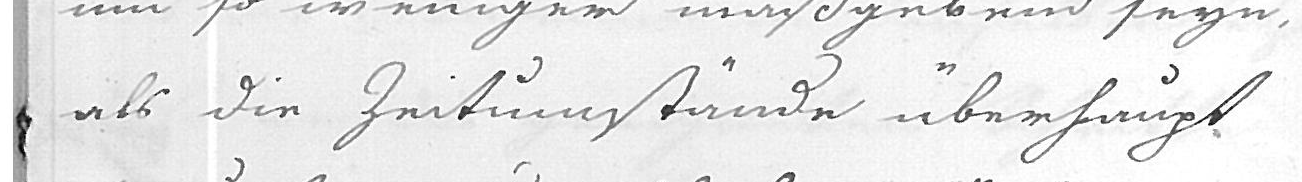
als die Zeitumstände überhaupt
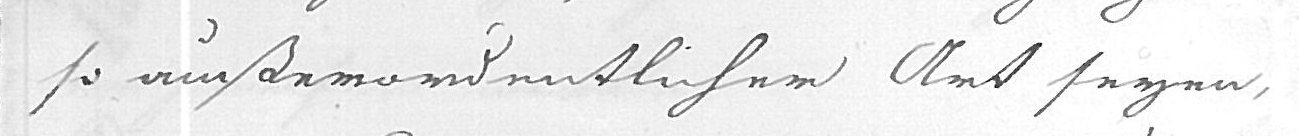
so außerordentlicher Art seyen,
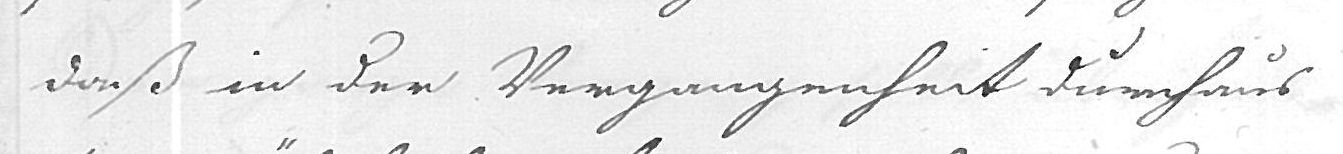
daß in der Vergangenheit durchaus
